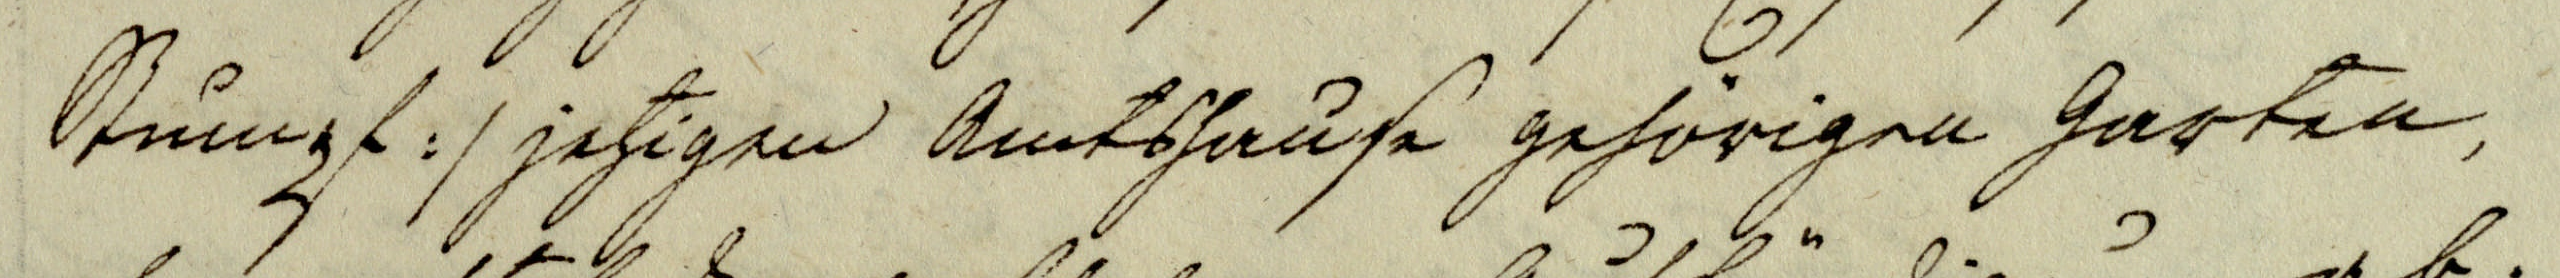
Stumpf :/ jetzigen Amtshause gehörigen Garten,
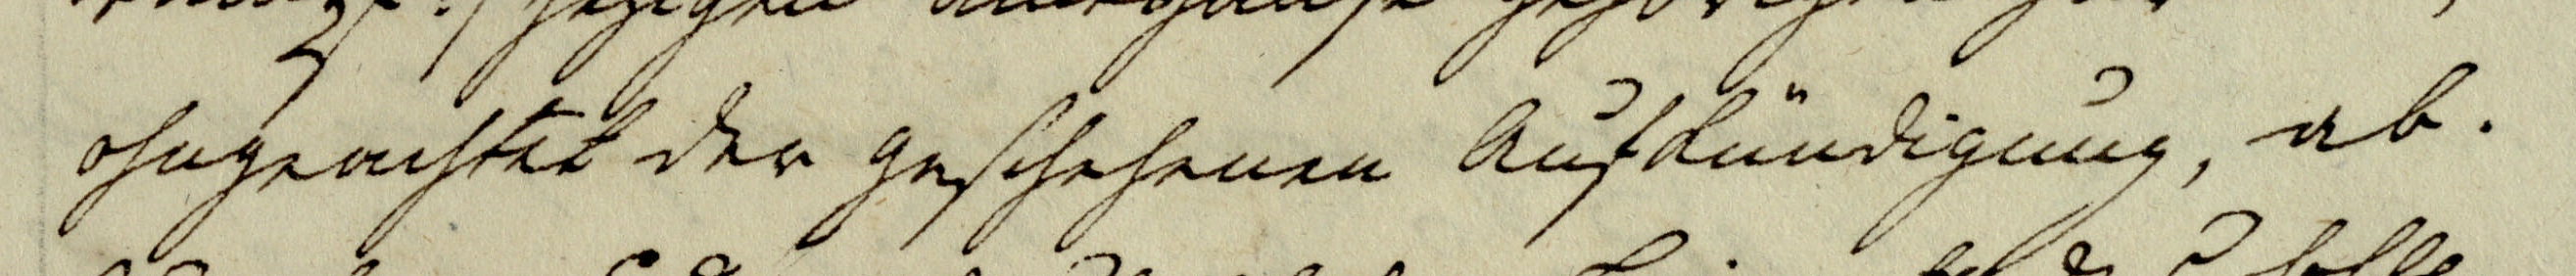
ohngeachtet der geschehenen Aufkündigung, ab¬
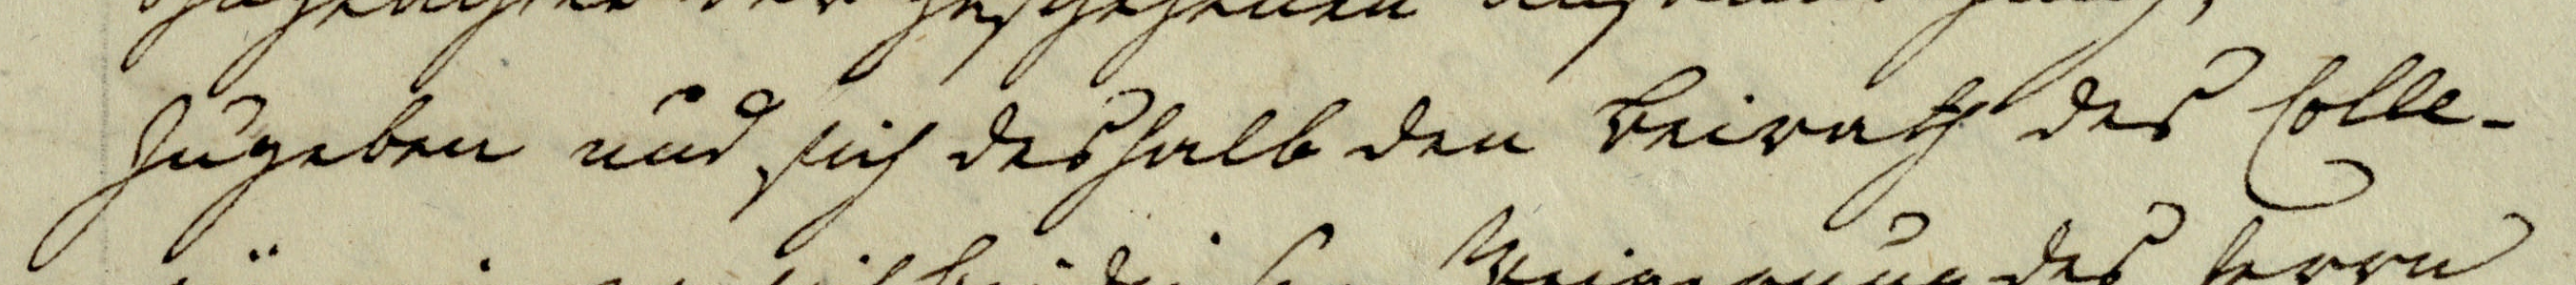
zugeben und sich deshalb den Beirath des Colle¬
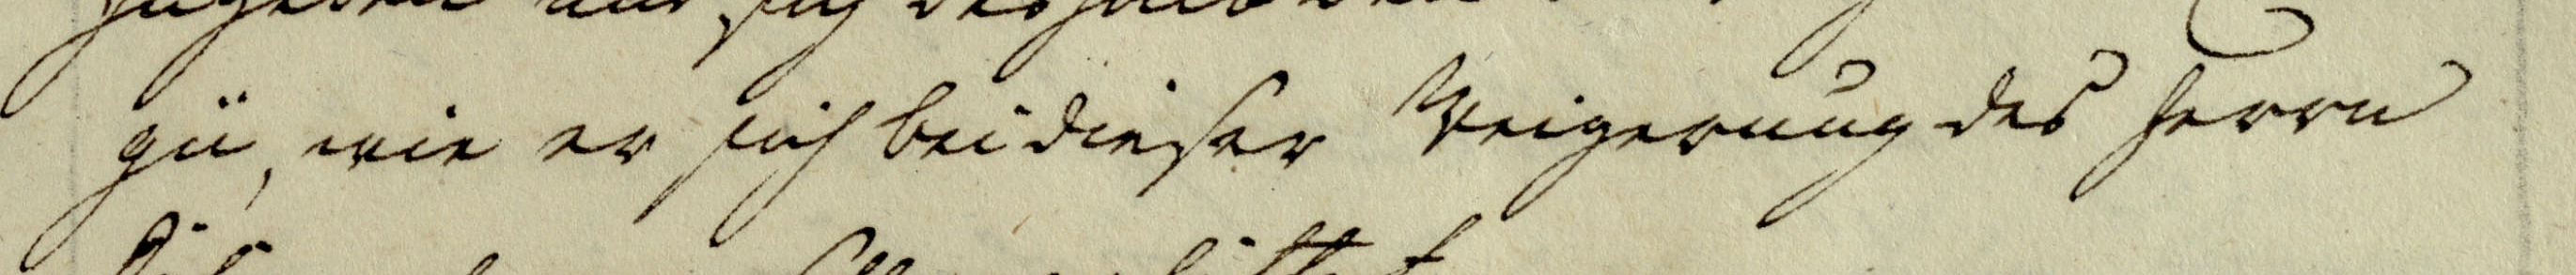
gii, wie er sich bei dieser Weigerung des Herrn
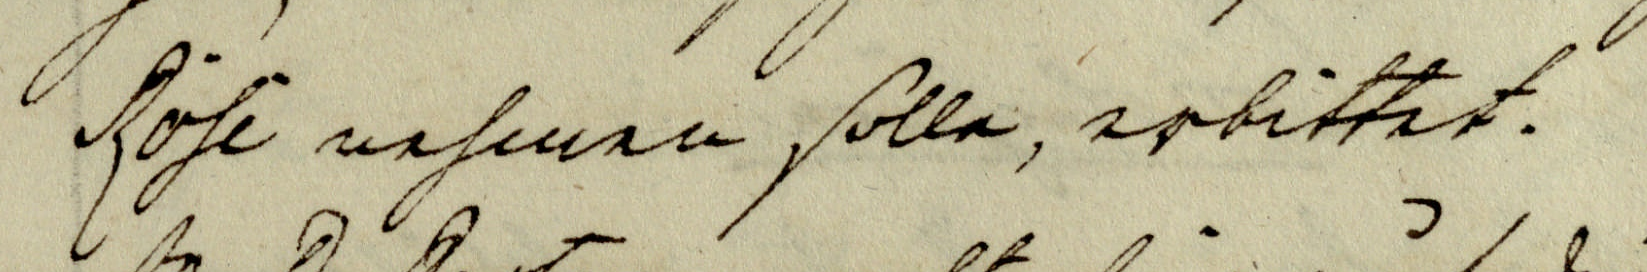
Röse nehmen solle, erbittet.
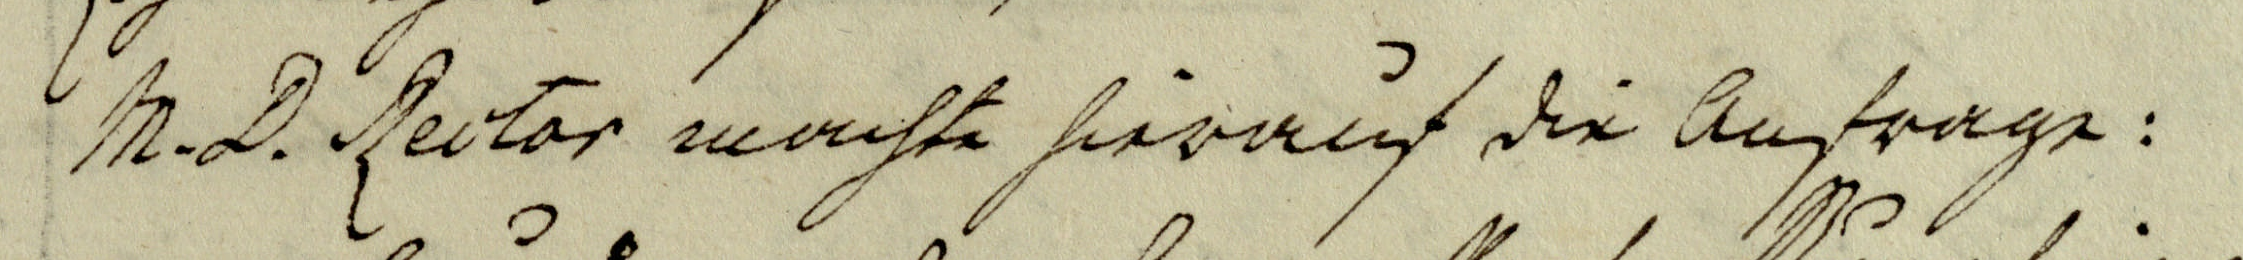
M. D. Rector machte hierauf die Anfrage:
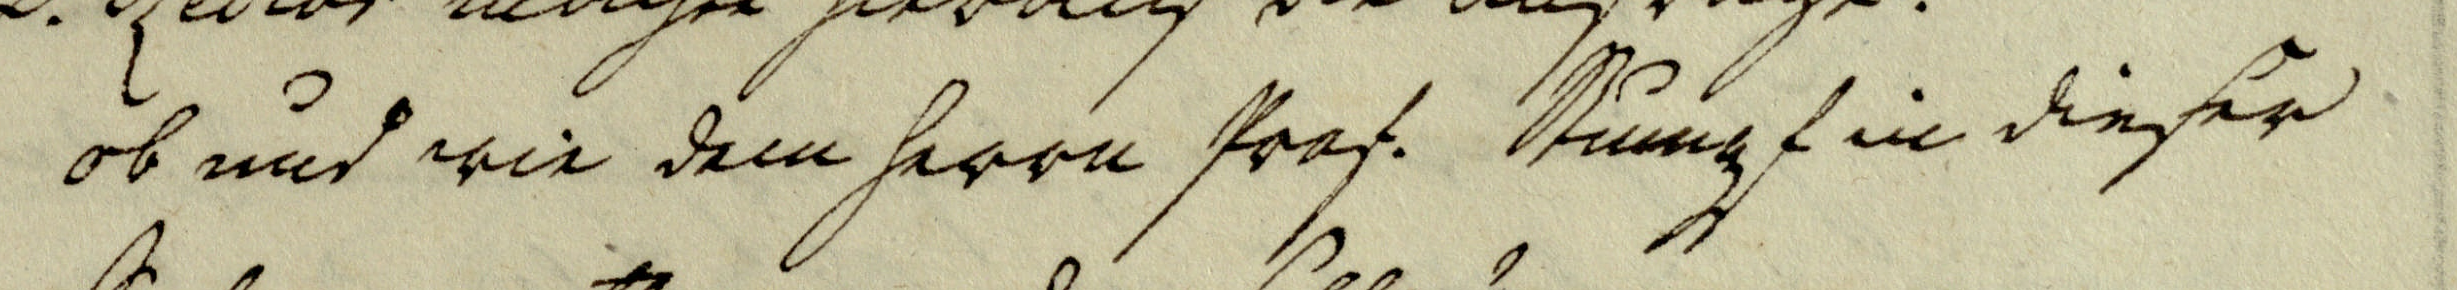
ob und wie dem Herrn Prof. Stumpf in dieser
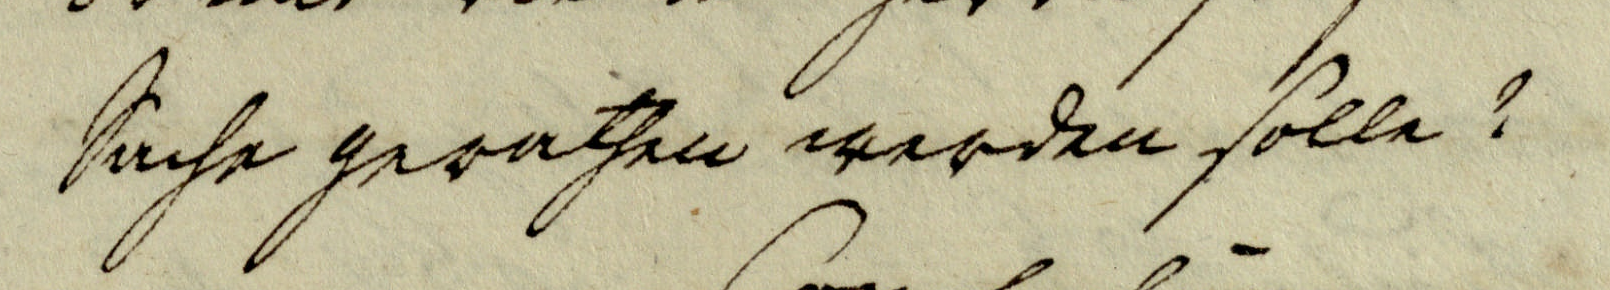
Sache gerathen werden solle?
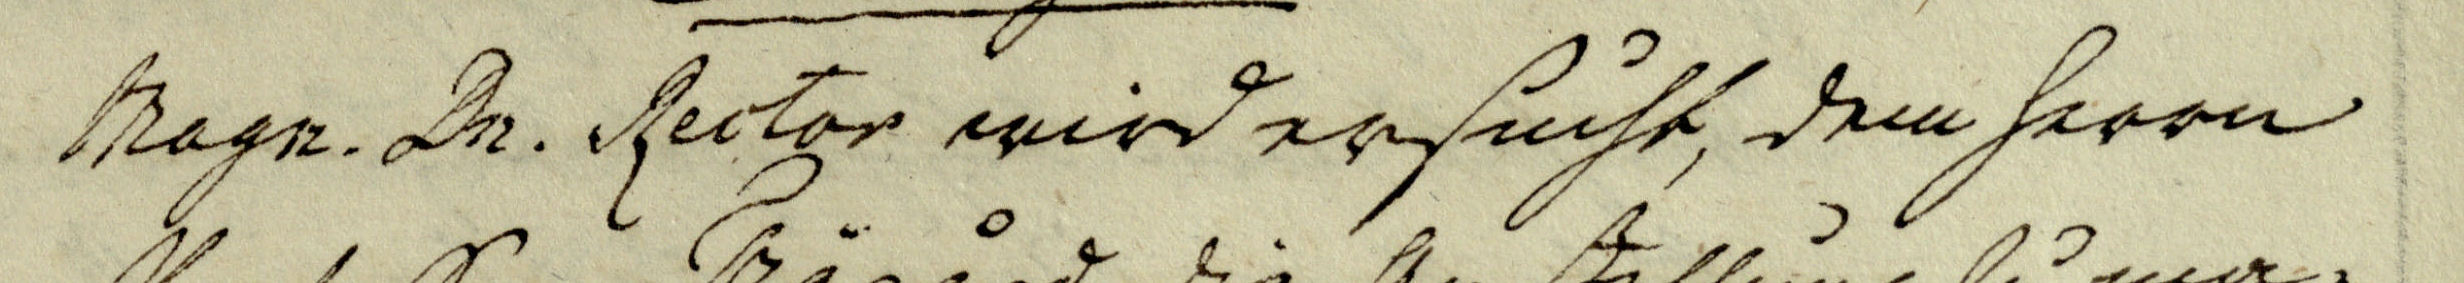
Magn. Dn. Rector wird ersucht, dem Herrn
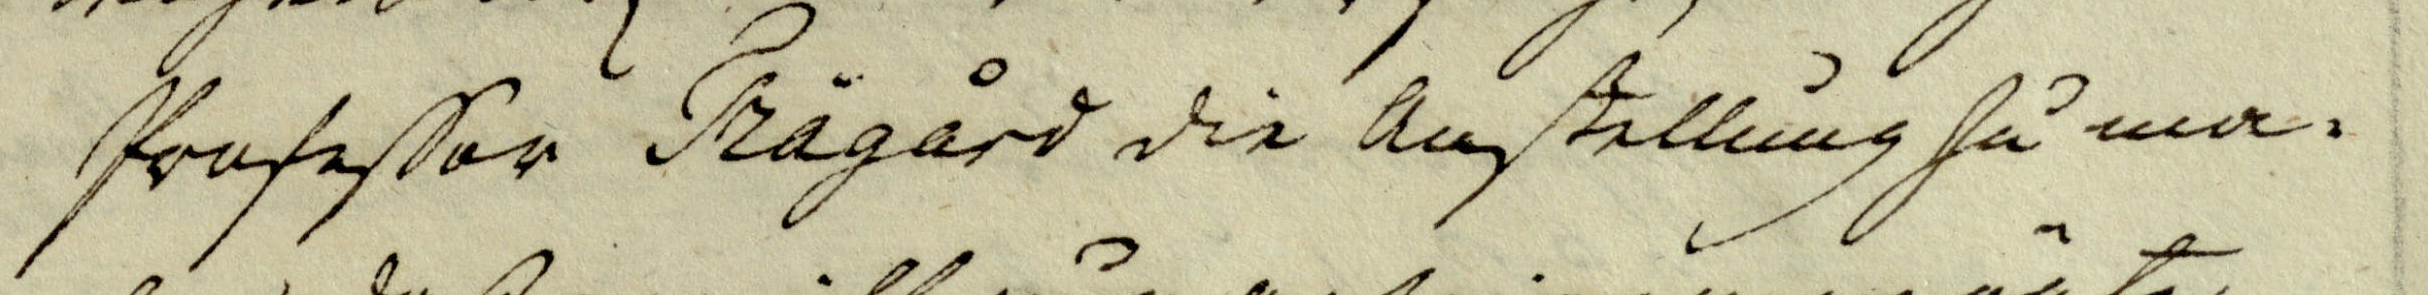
Professor Trägård die Anstellung zu ma¬
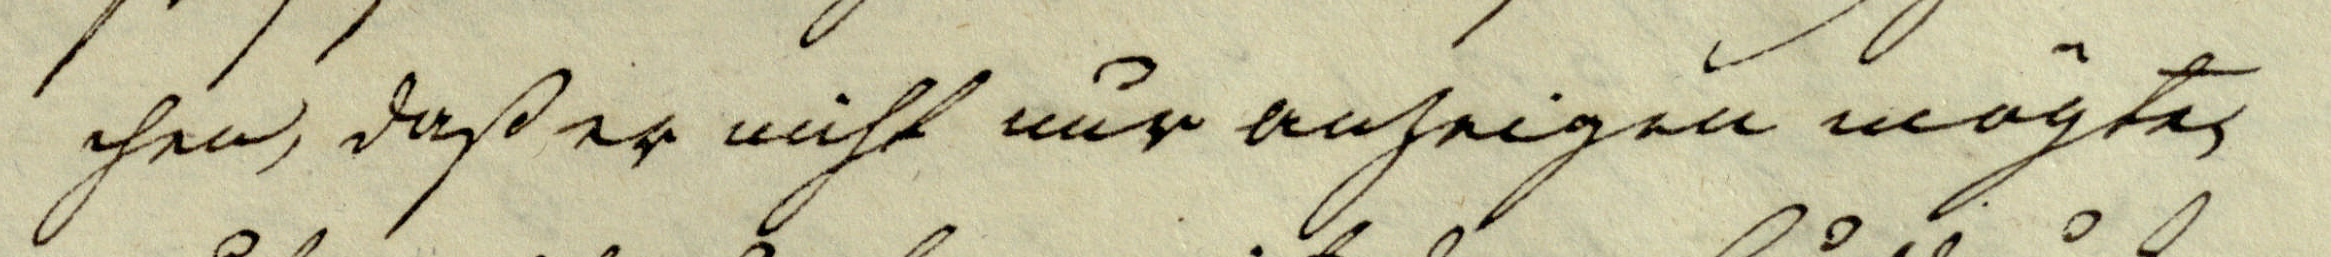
chen, daß er nicht nur anzeigen mögte,
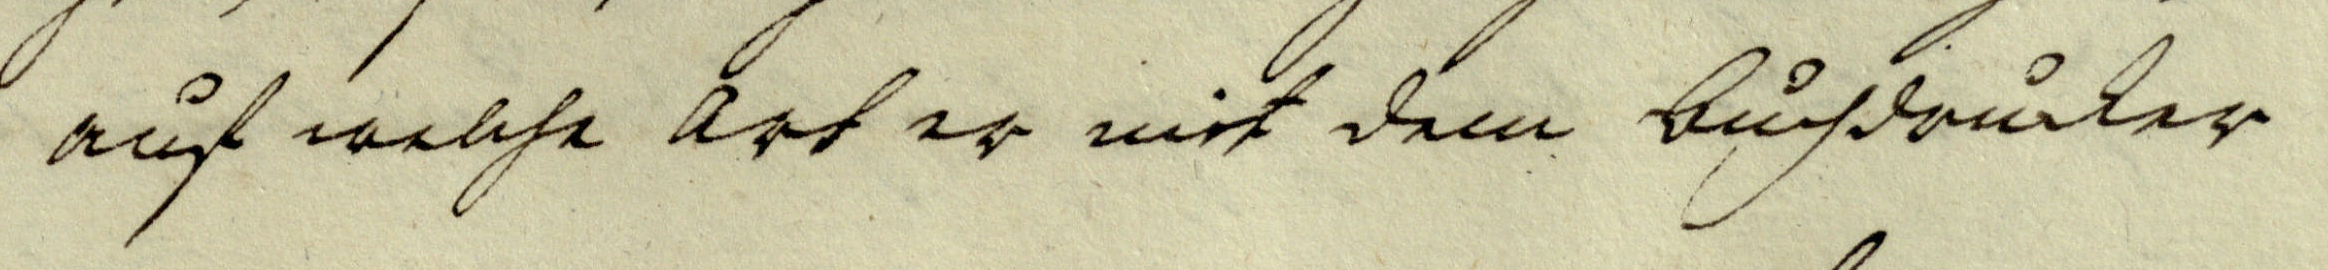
auf welche Art er mit dem Buchdrucker
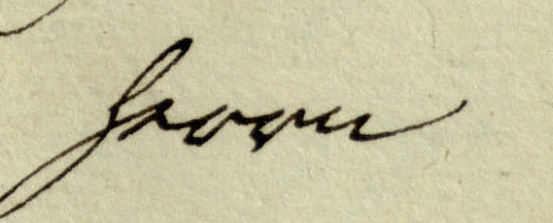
Herrn
